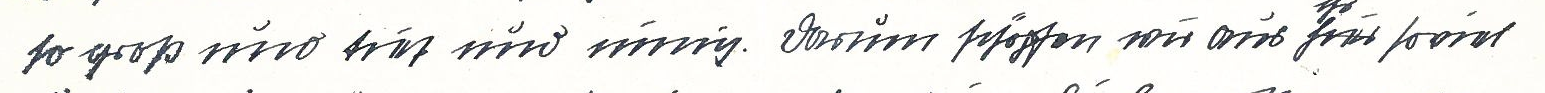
so groß und tief und innig. Darum schöpfen wir aus hier soviel
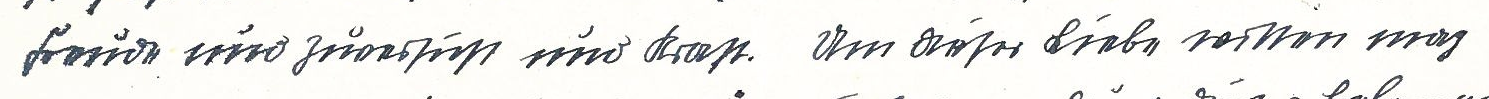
Freude und Zuversicht und Kraft. Um dieser Liebe willen mag
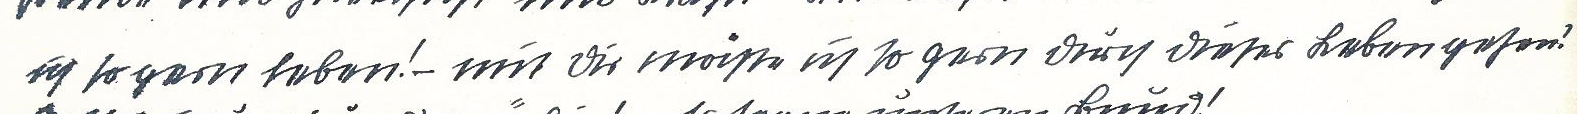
ich so gern leben! – mit Dir möchte ich so gern durch dieses Leben gehen!
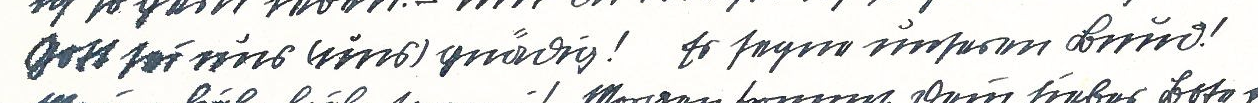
Gott sei uns (uns) gnädig! Er segne unseren Bund!
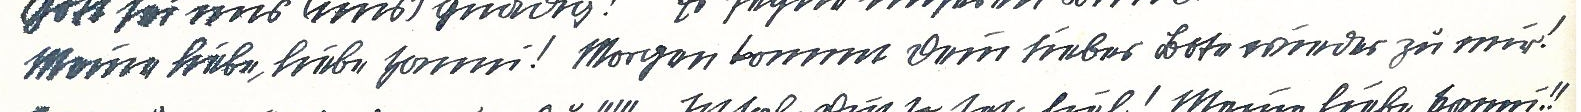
Meine liebe, liebe! Morgen kommt dein lieber Bote wieder zu mir!
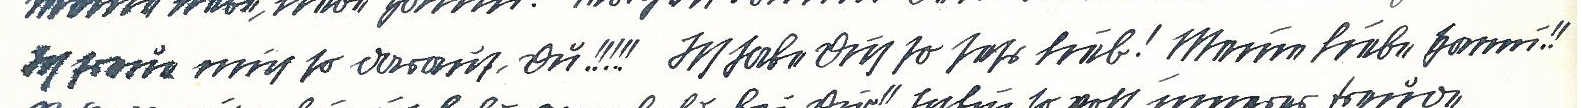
Ich freue mich so darauf, Du!!!!! Ich habe dich so sehr lieb! Meine liebe
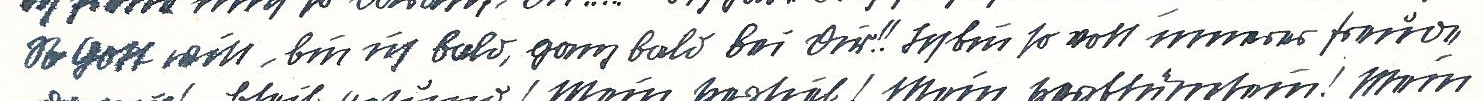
!! So Gott will, bin ich bald, ganz bald bei Dir!! Ich bin so voll innerer Freude
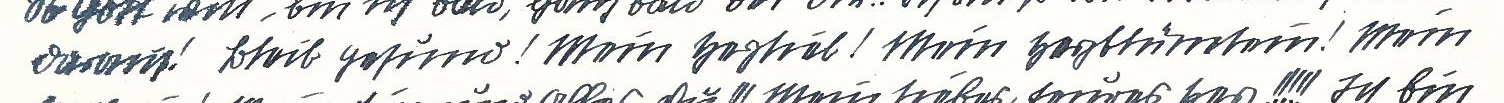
darauf! Bleib gesund! Mein Herzlieb! Mein Herzblümelein! Mein
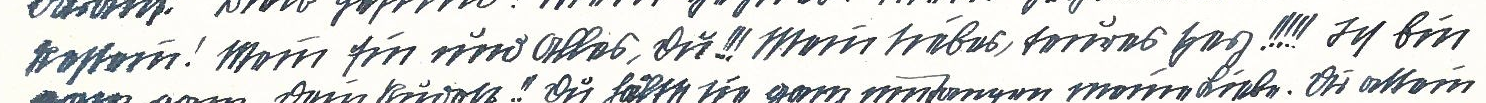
Rehlein! Mein Ein und Alles, Du!!! Mein liebes, teures Herz!!!!! Ich bin
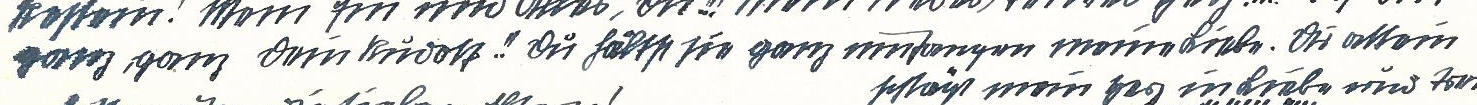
ganz, ganz Dein Rudolf!! Du hältst sie ganz umfangen meine Liebe. Dir allein
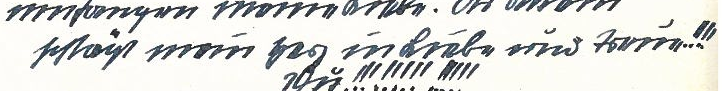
schlägt mein Herz in Liebe und Treue!!!!
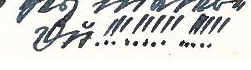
Du!!!!!!!!!!!!!
